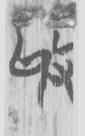收
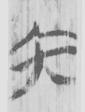內
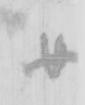廿
